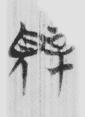親
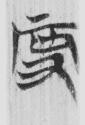辱
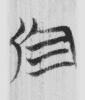於
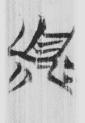寡
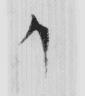人
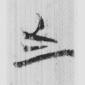之
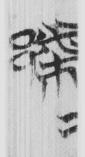{邑㡀}=
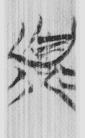寡
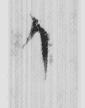人
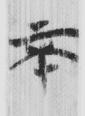不
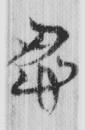忍
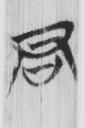君
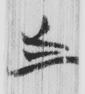之
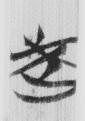武
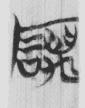礪
